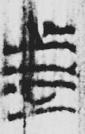者
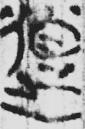道
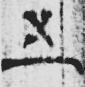之
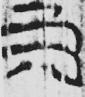而
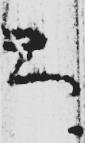已
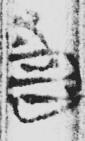○（詩）
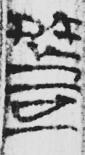箸（書）
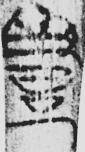豊（禮）
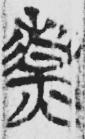藥（樂）
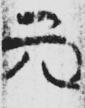亓（其）
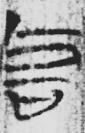○（始）
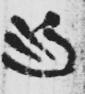出
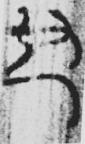也
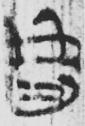皆
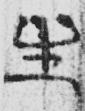生
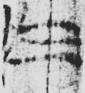於
